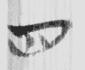四
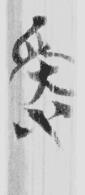爯
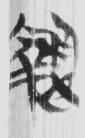執
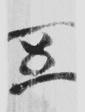五
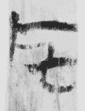厇
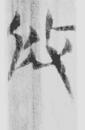攸
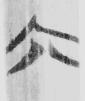六
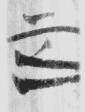正
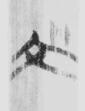文
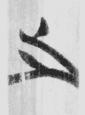之
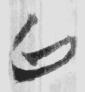㠯（以）
